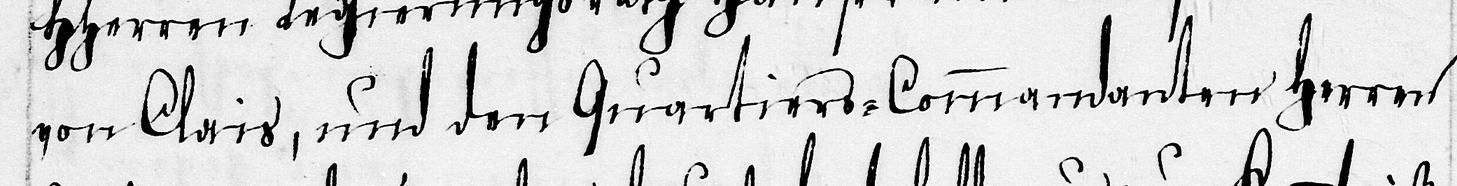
von Clais, und den Quartiers-Commandanten Herren
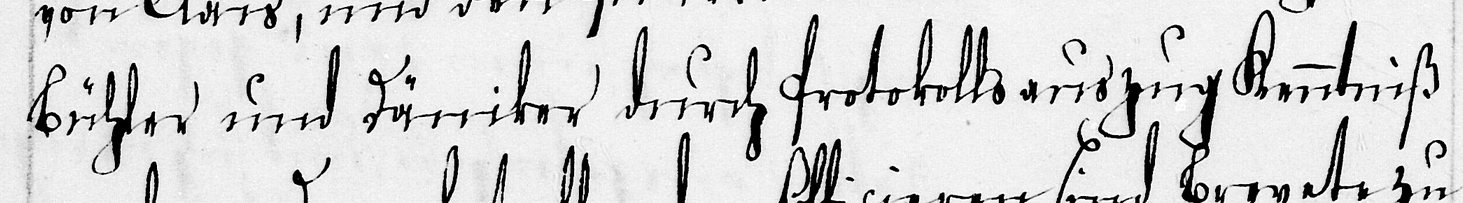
Bühler und Däniker durch Protokollsauszug Kenntniß
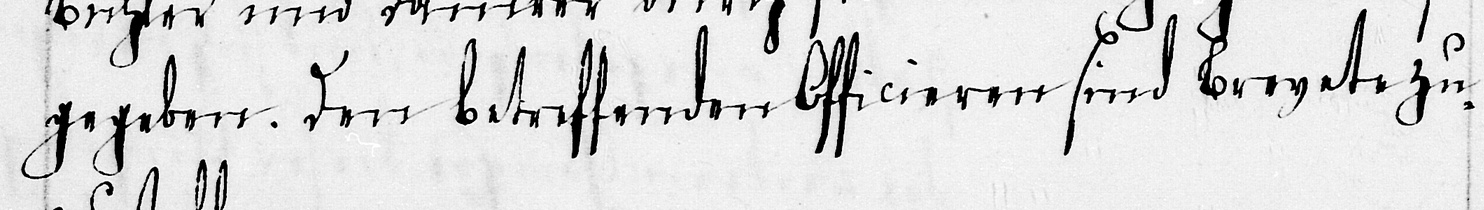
gegeben. Den betreffenden Officieren sind Brevete zu¬
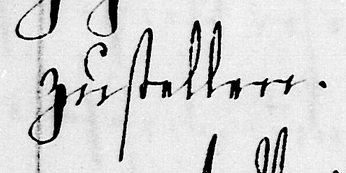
zustellen.
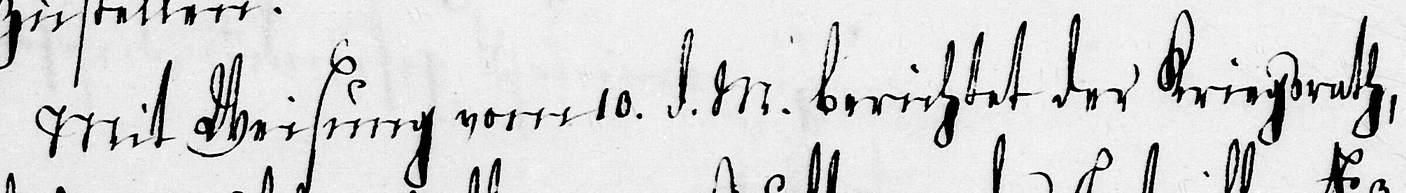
Mit Weisung vom 10. d. M. berichtet der Kriegsrath,
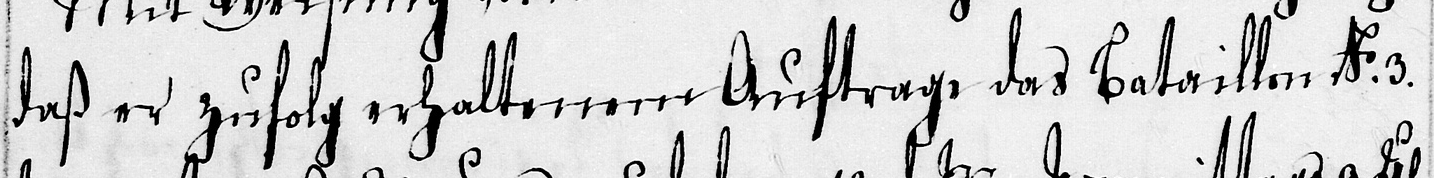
daß er zufolg erhaltenem Auftrage das Bataillon No.
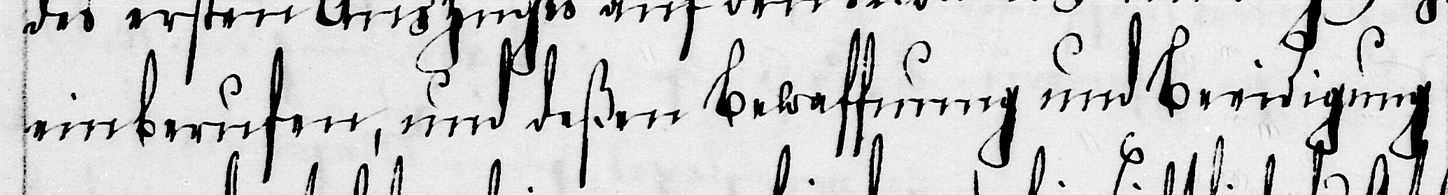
einberufen, und deßen Bewaffnung und Beeidigung
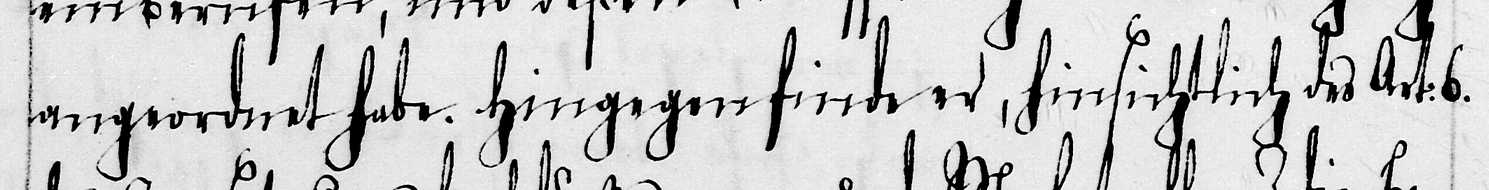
angeordnet habe. Hingegen finde er, hinsichtlich des Art:
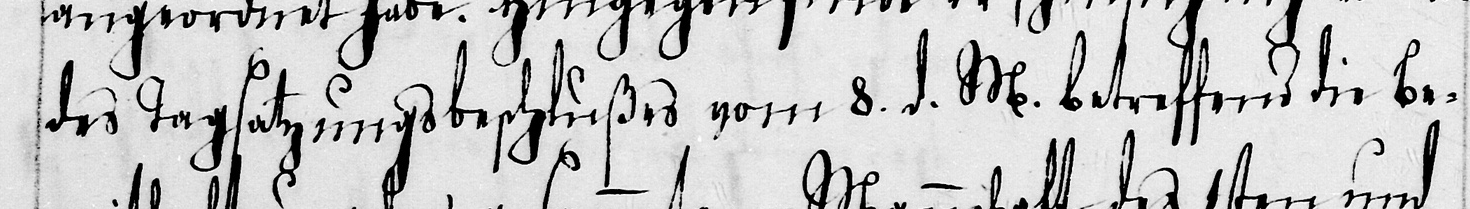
des Tagsatzungsbeschlußes vom 8. d. M. betreffend die Be¬
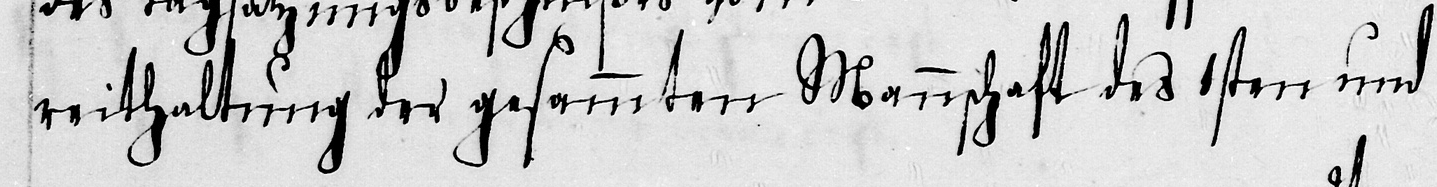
reithaltung der gesammten Mannschaft des 1sten und
